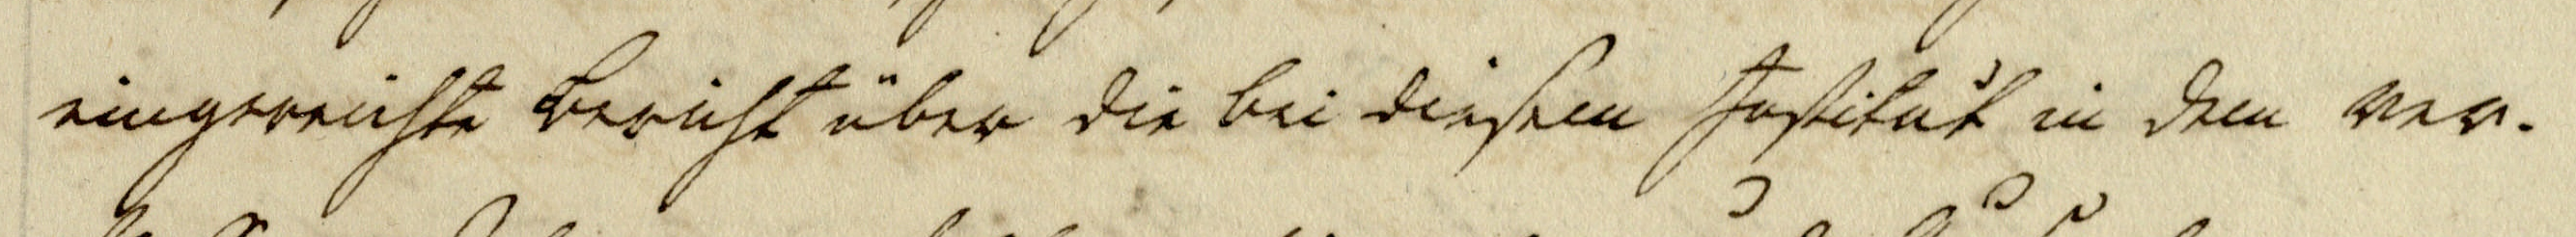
eingereichte Bericht über die bei diesem Institut in dem ver¬
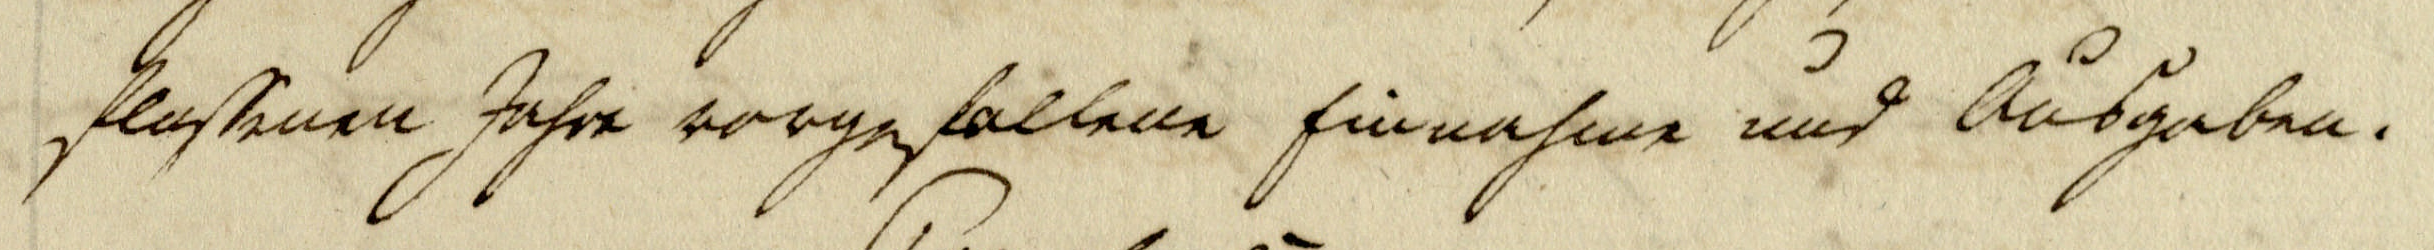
flossenen Jahre vorgefallene Einnahme und Ausgaben.
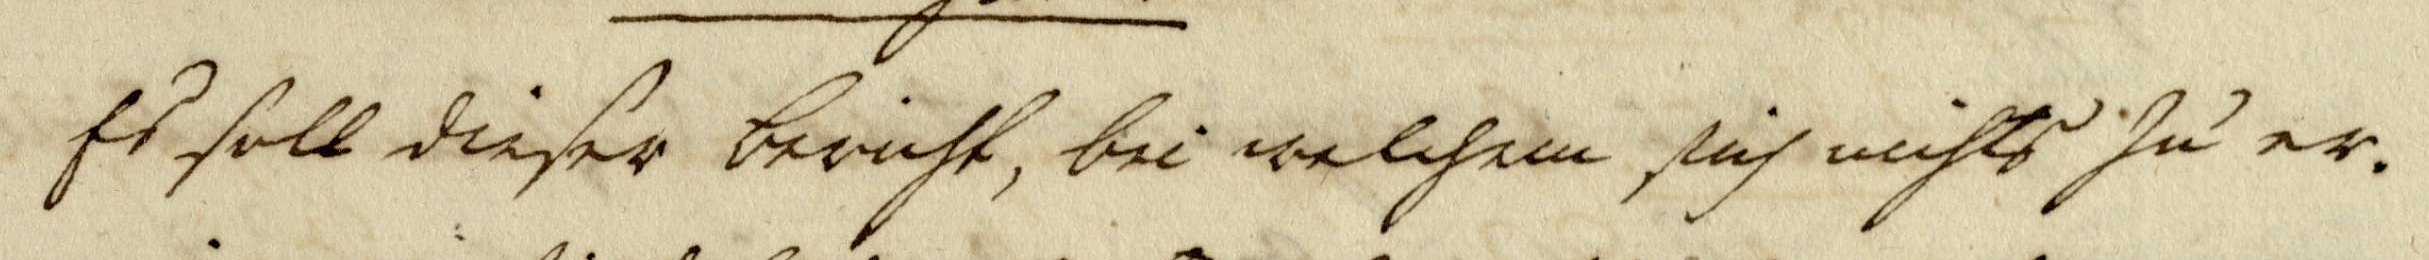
Es soll dieser Bericht, bei welchem sich nichts zu er¬
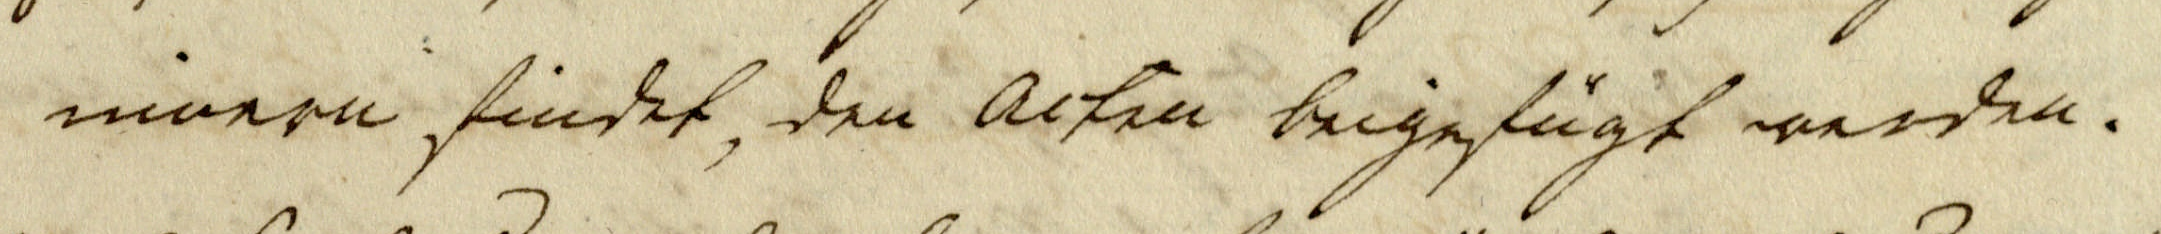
innern findet, den Acten beigefügt werden.
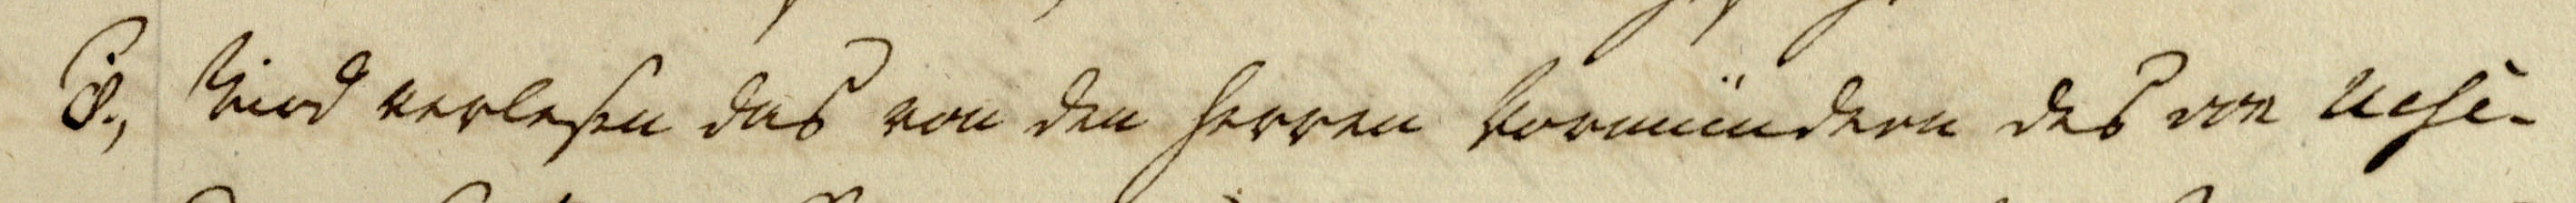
8., Wird verlesen das von den Herren Vormündern des von Uese¬
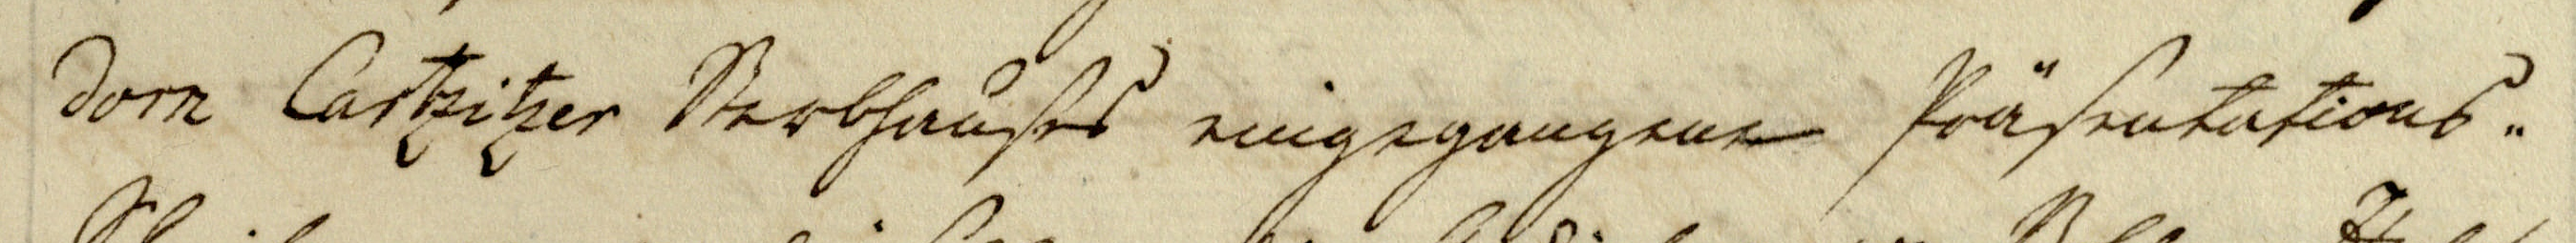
dom Cartzitzer Sterbhauses eingegangene Präsentations¬
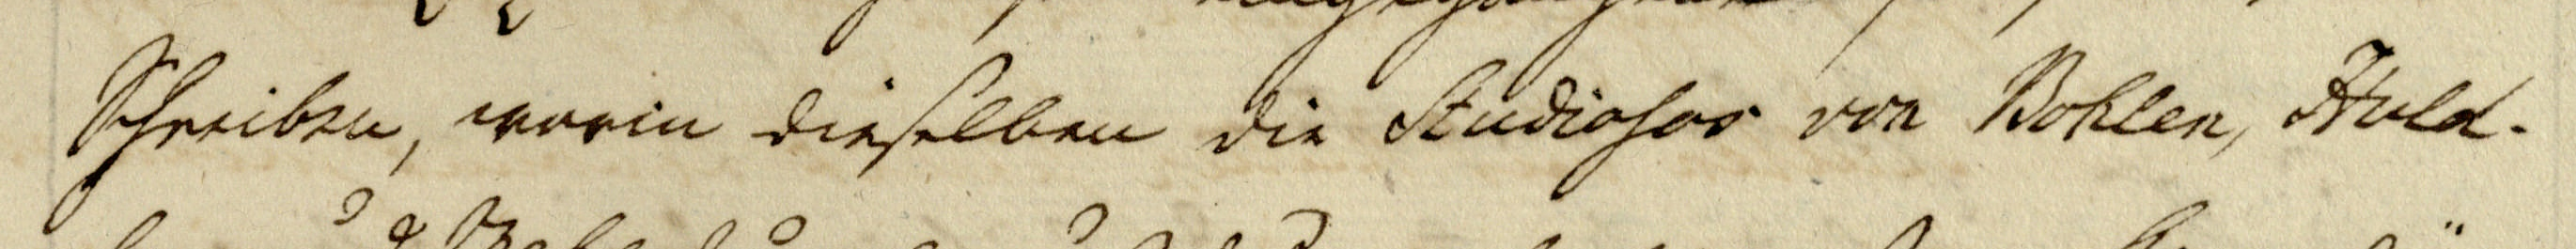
Schreiben, worin dieselben die Studiosos von Bohlen, Huld¬
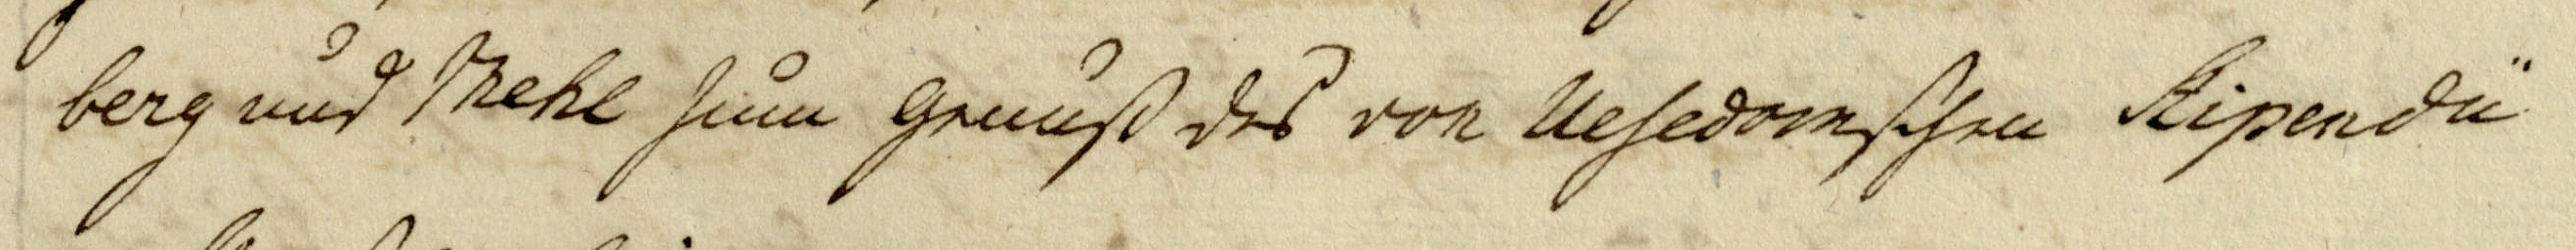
berg und Mehl zum Genuß des von Uesedomschen Stipendii
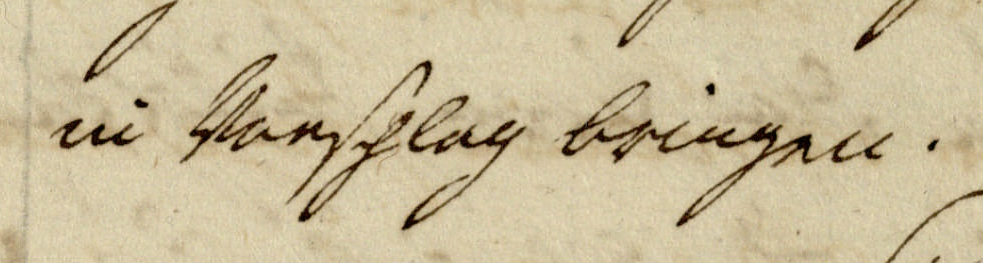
in Vorschlag bringen.
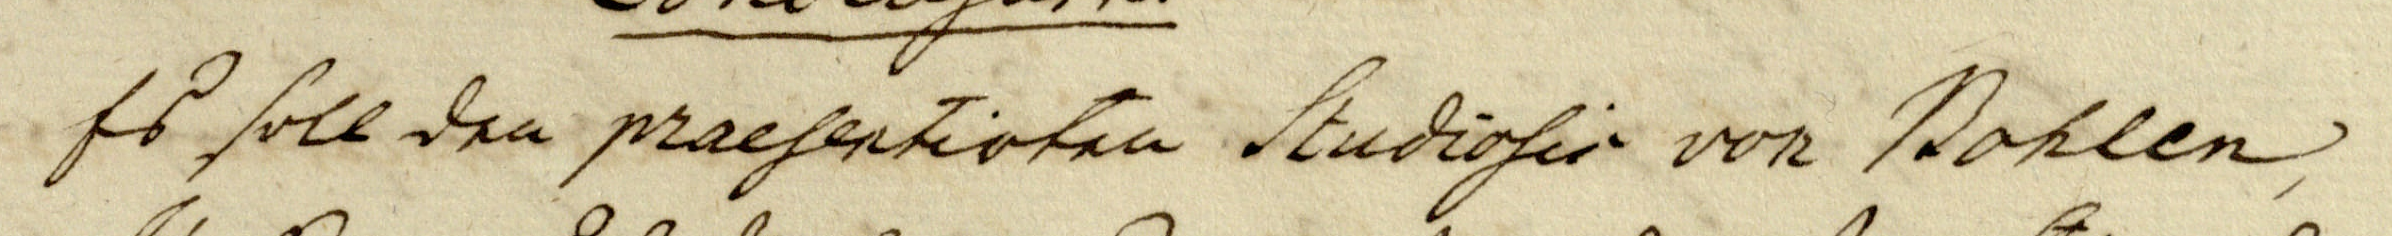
Es soll den praestntirten Studiosis von Bohlen,
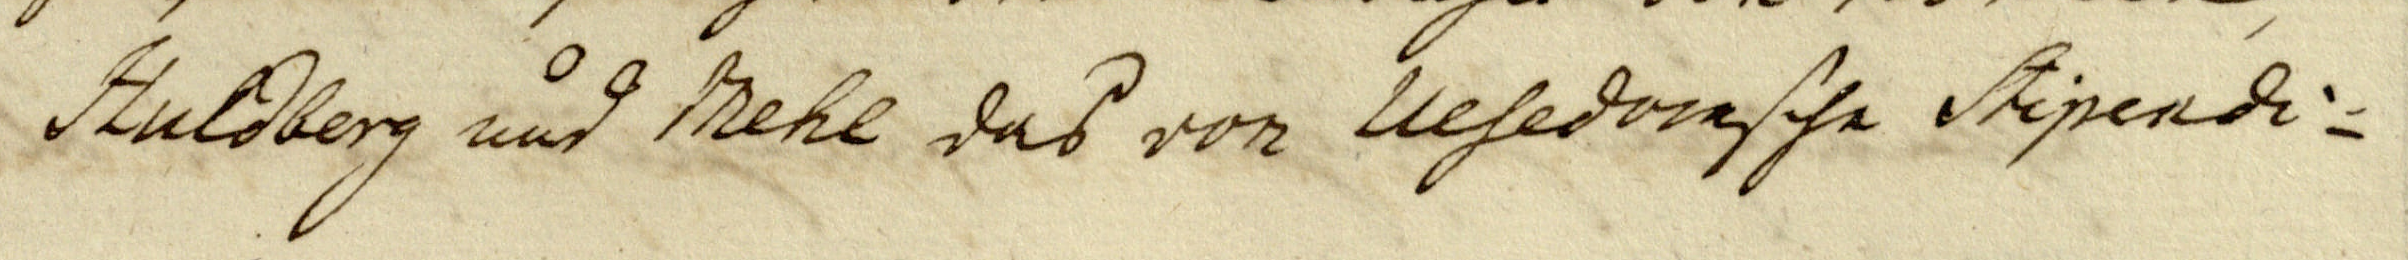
Huldberg und Mehl das von Uesedomsche Stipendi¬
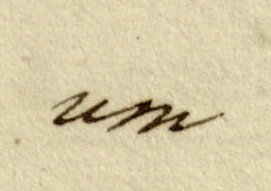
um
